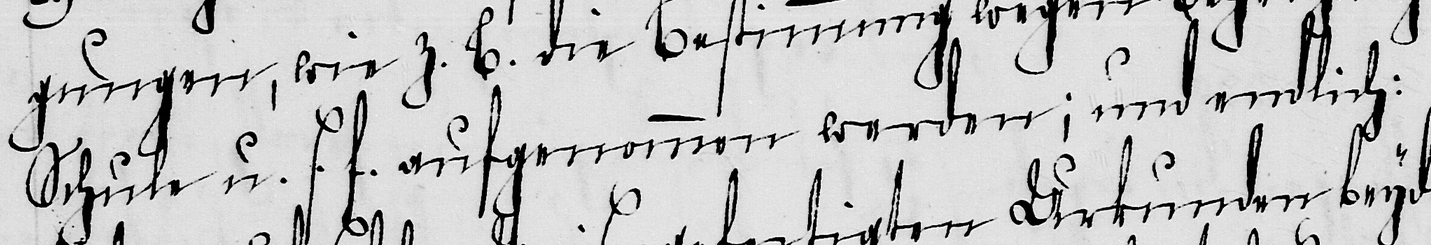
Schule u. s. f. aufgenommen werden; und endlich:
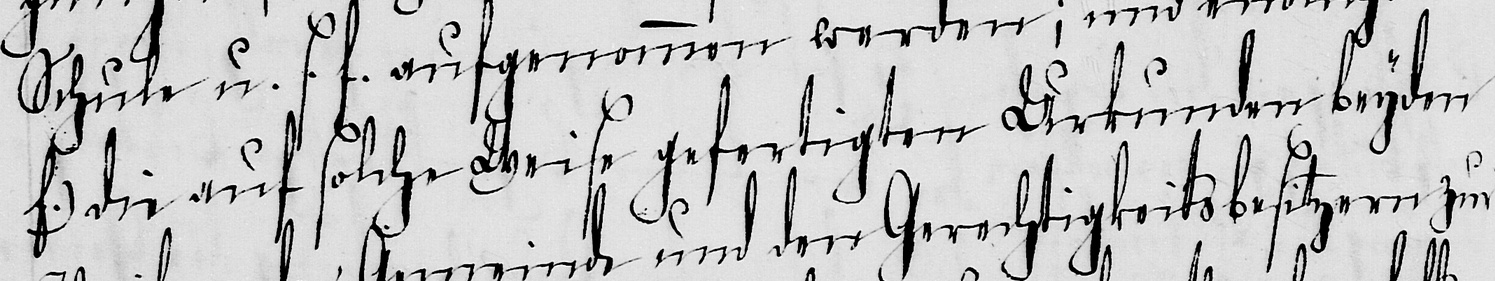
f.) die auf solche Weise gefertigten Urkunden beyden
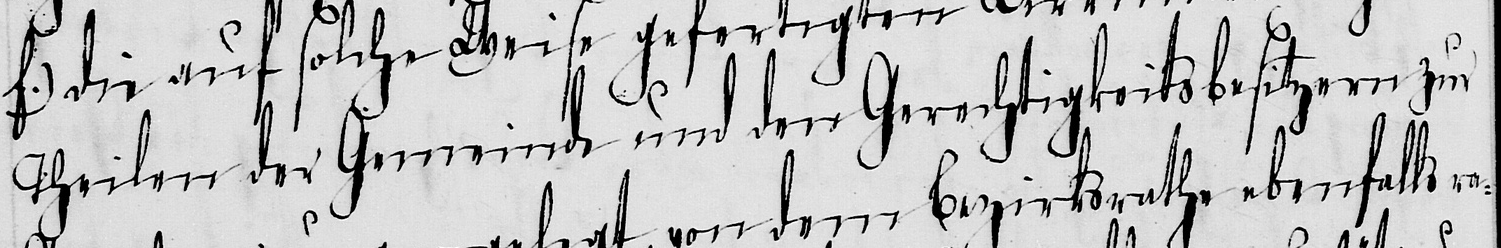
Theilen der Gemeinde und den Gerechtigkeitsbesitzern zur
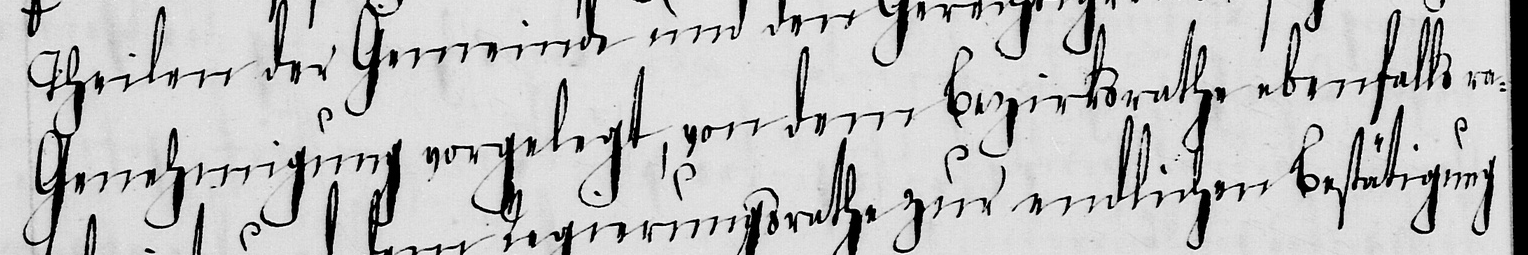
Genehmigung vorgelegt, von dem Bezirksrathe ebenfalls r¬
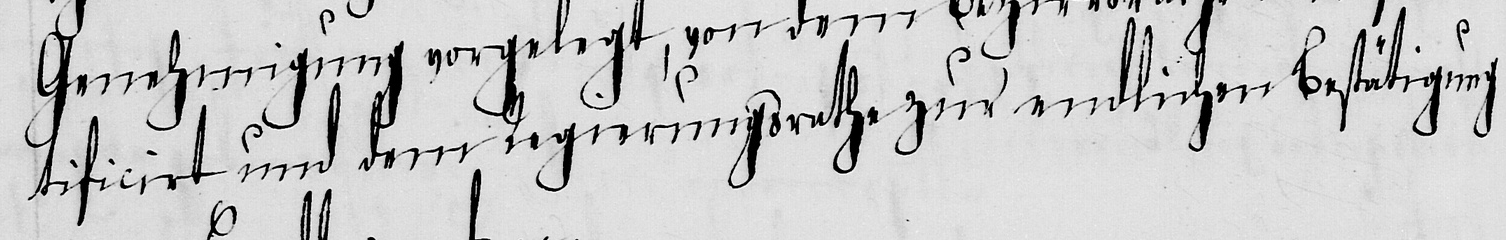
atificirt und dem Regierungsrathe zur endlichen Bestätigung
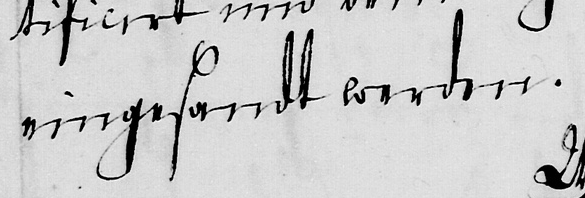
eingesandt werden.
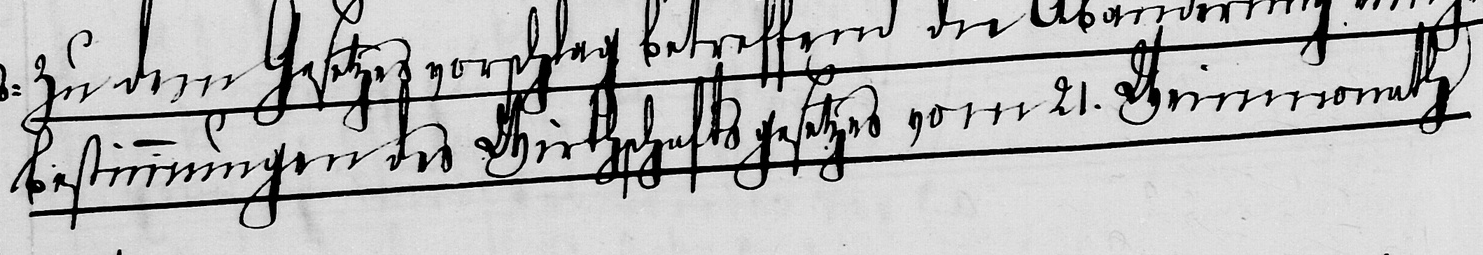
Bestimmungen des Wirthschaftsgesetzes vom 21. Weinmonath
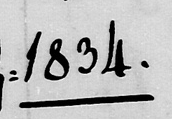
1834.
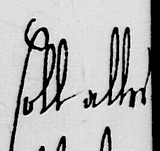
soll
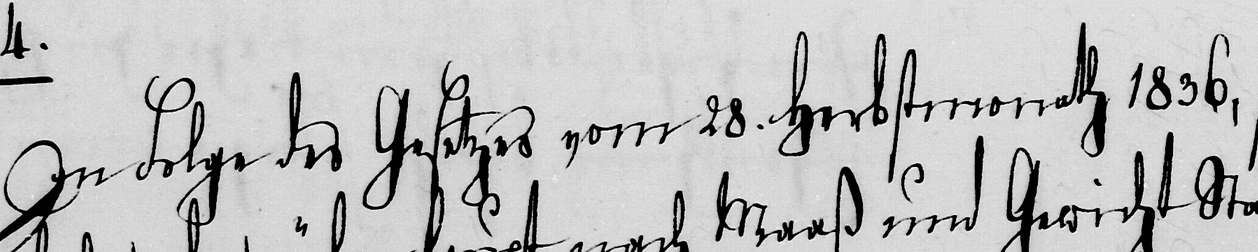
In Folge des Gesetzes vom 28. Herbstmonath 1836,
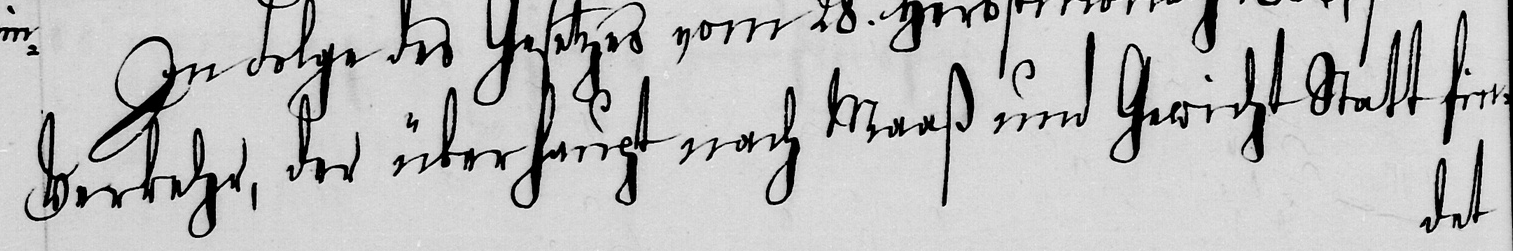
Verkehr, der überhaupt nach Maaß und Gewicht Statt fi¬
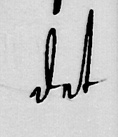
dem
